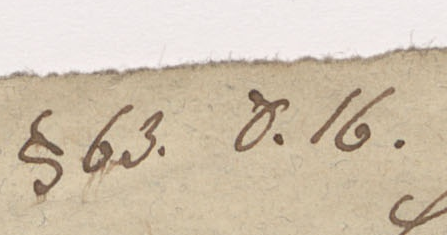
§ 63. S. 16.
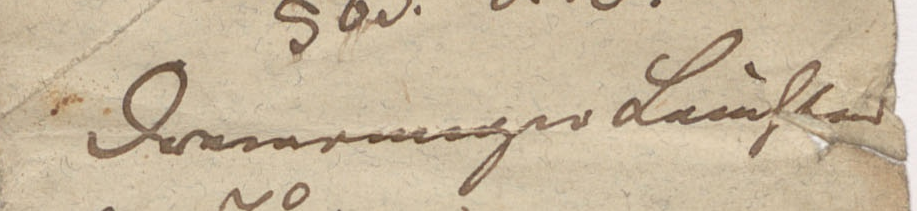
Dreiarmiger Leuchter
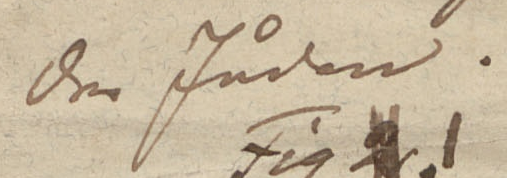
der Juden.
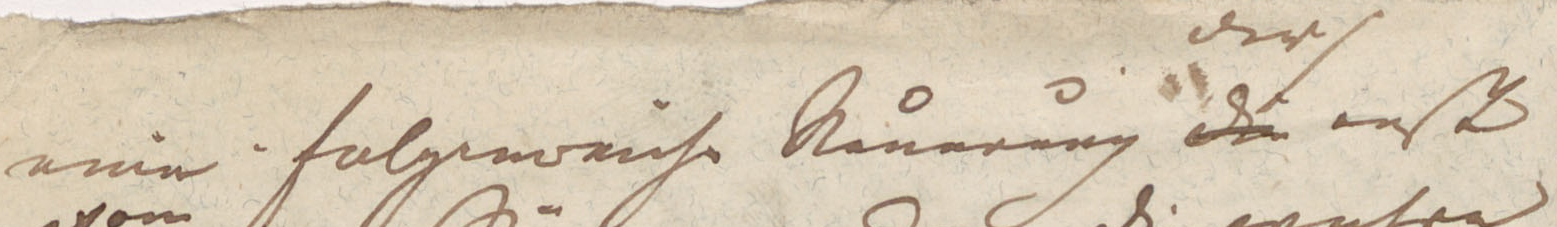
eine folgenreiche Neuerung die der erst
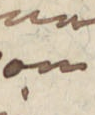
bei von
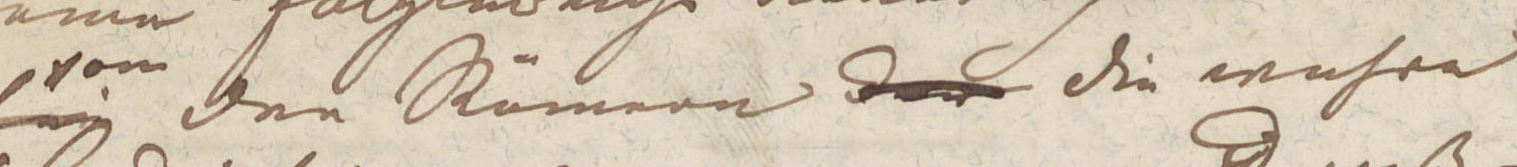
den Römern der die wahre
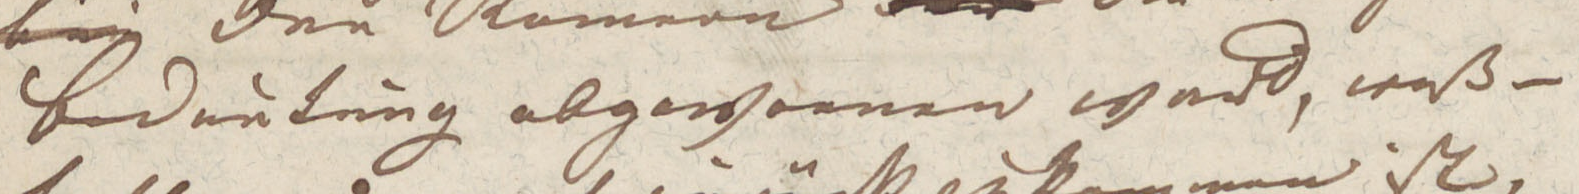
Bedeutung abgewonnen ward, wess-
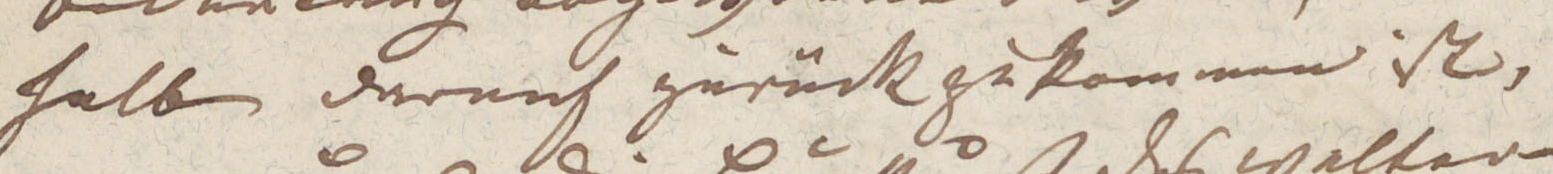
halb darauf zurückzukommen ist,
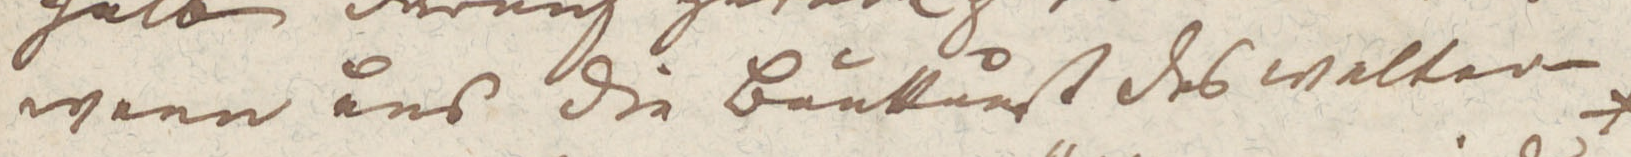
wenn uns die Baukunst des welter-
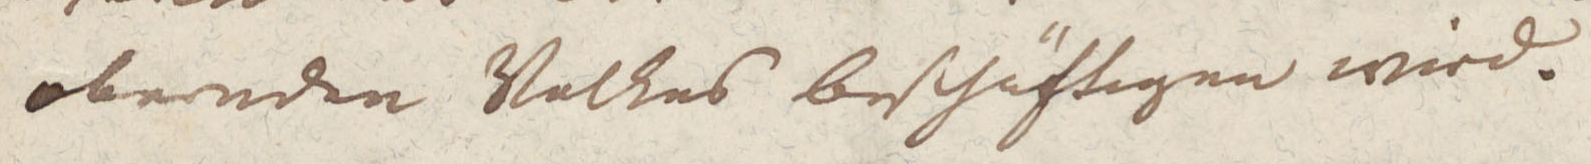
obernden Volkes beschäftigen wird. %
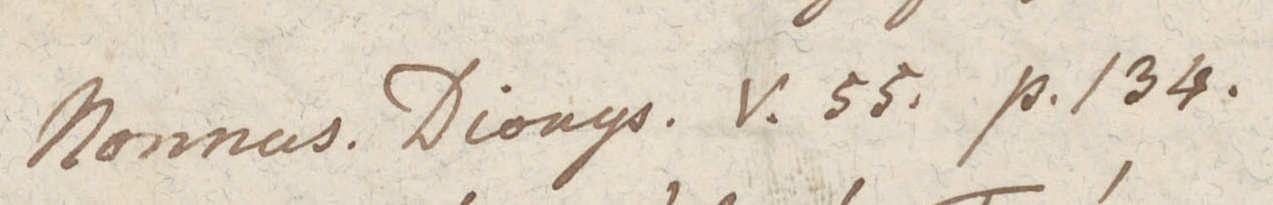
% Nonnus. Donys. V. 55. p. 134.
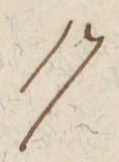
17.
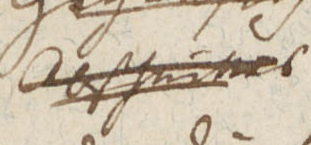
Aegypten. Altes
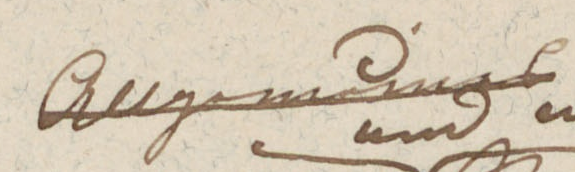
Allgemeines
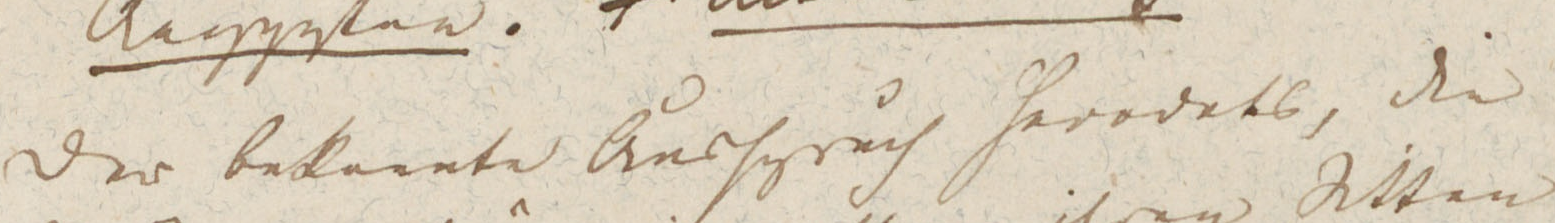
Der bekannte Ausspruch Herodots, die
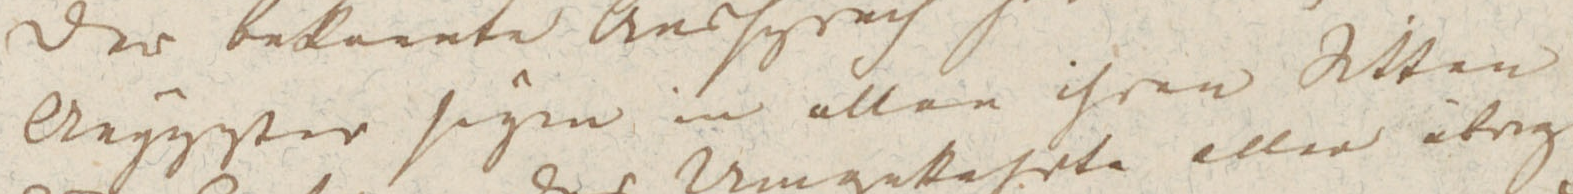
Aegypter seyen in allen ihren Sitten
